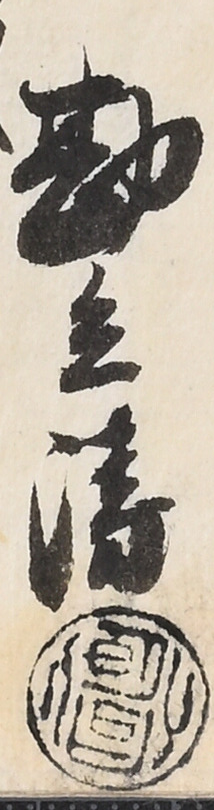勘兵衛㊞
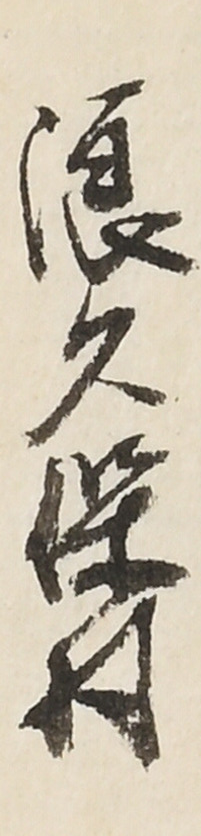浪久保村
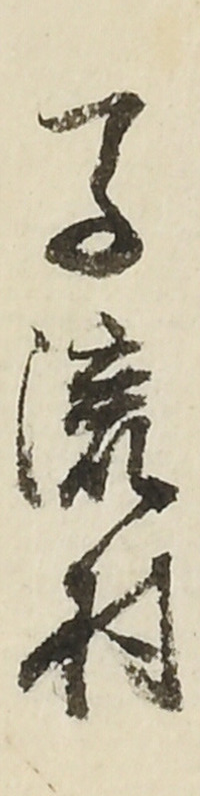馬流村

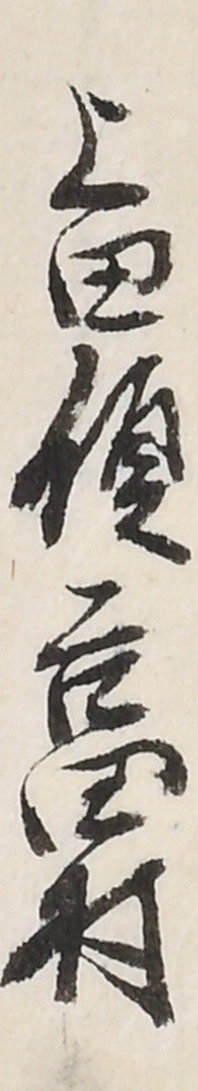上田領富村
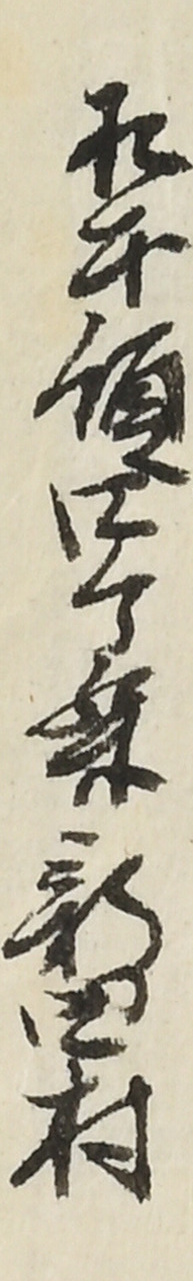松本領四ヶ乗新田村

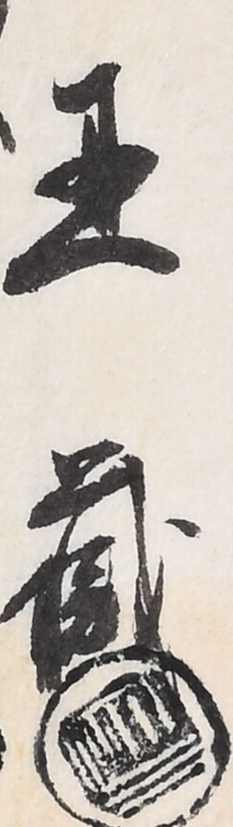丑蔵㊞
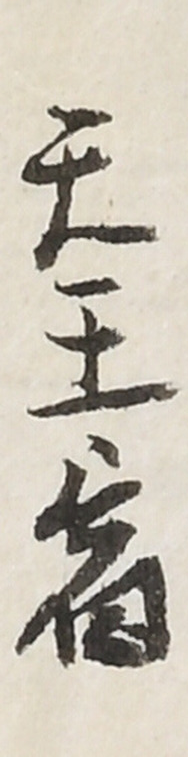天王宿
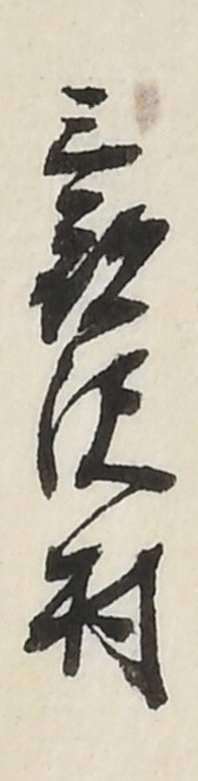三夜沢村
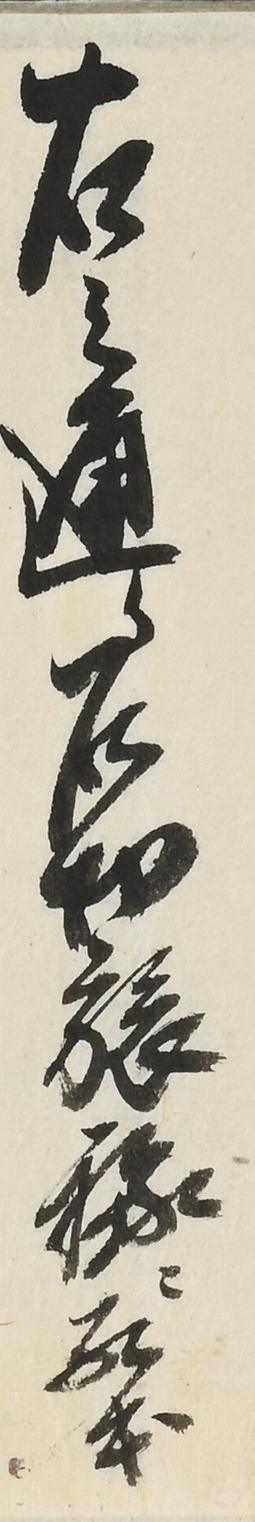右之通り石切旅稼ニ罷出
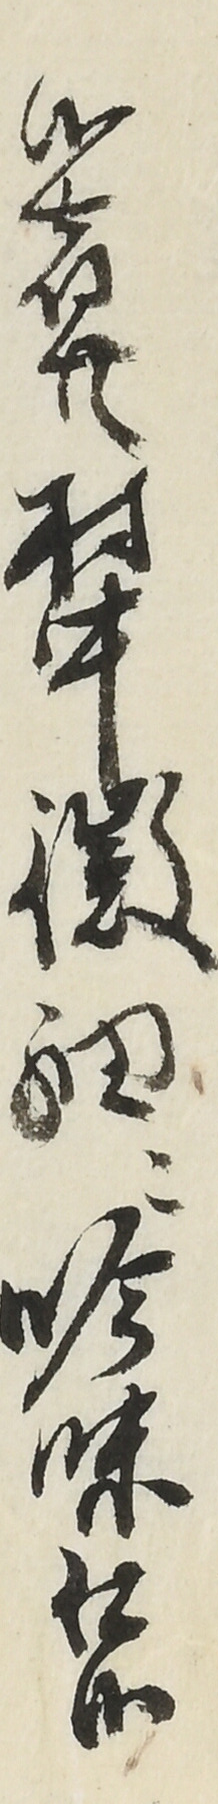候者共村中微細ニ吟味仕候
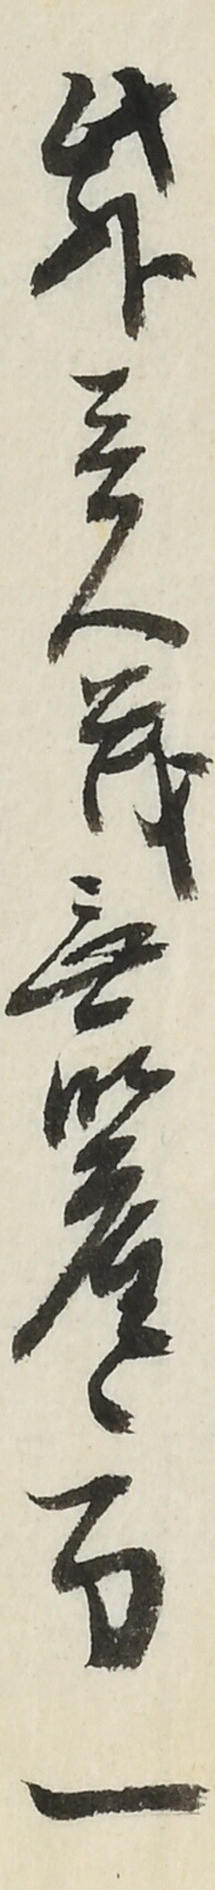此外壱人も無御座候万一
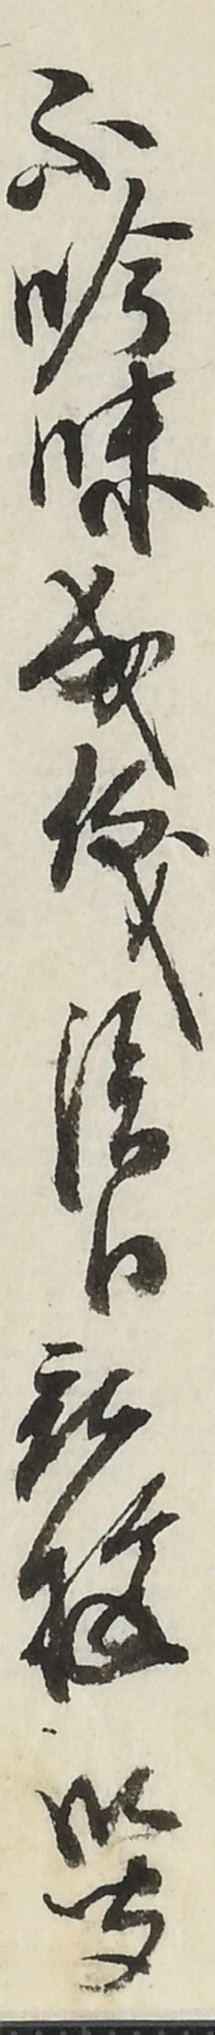不吟味成儀後日被遊御聞
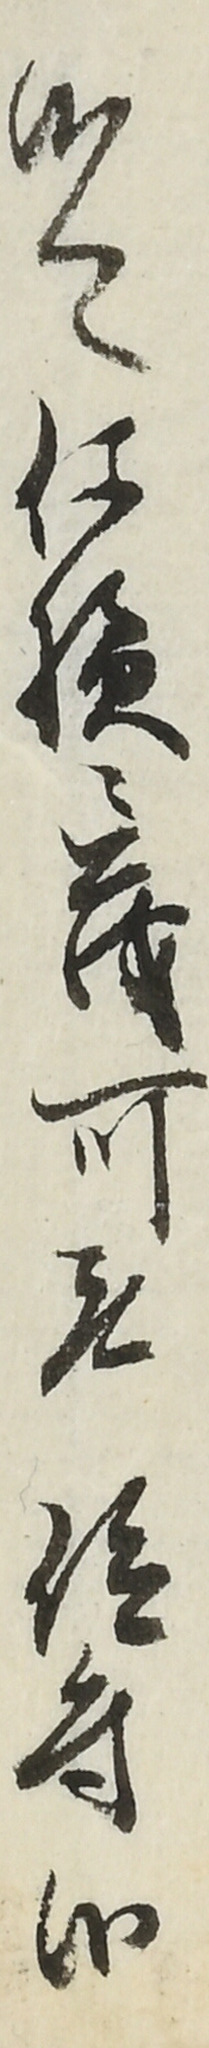候ハヽ何様ニも可被仰付候

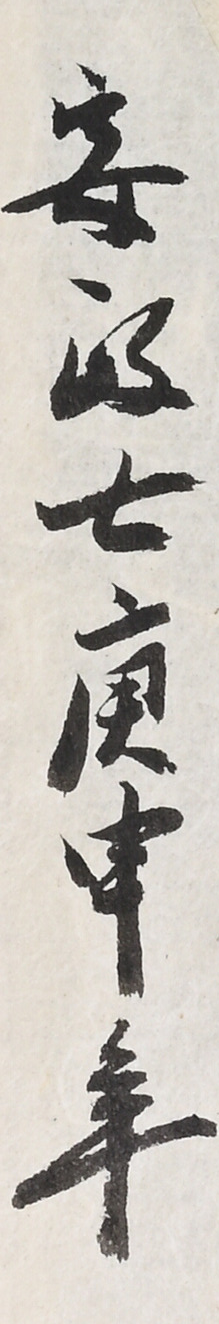安政七庚申年
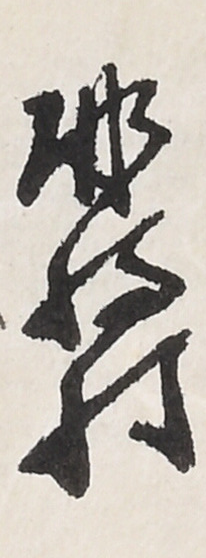非持村
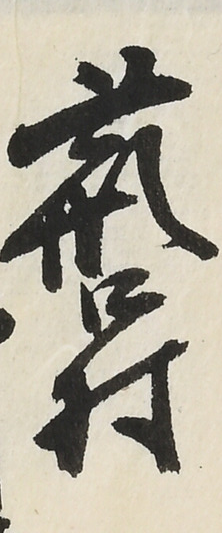荊口村
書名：安政七庚申年二月石切旅稼名前書上帳
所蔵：伊那市立高遠町図書館・合同会社AMANE
